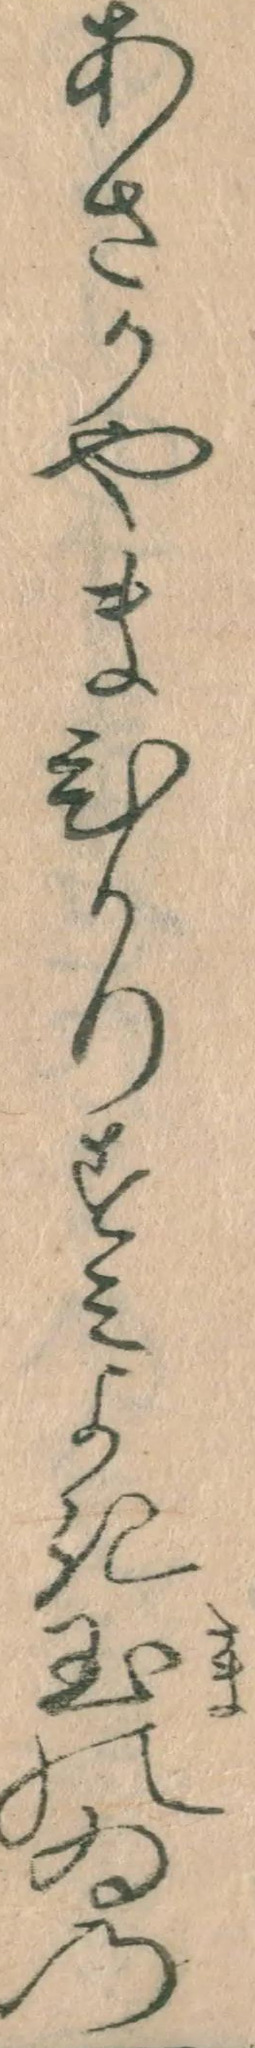あさかやまひかりすみよき玉のゐの
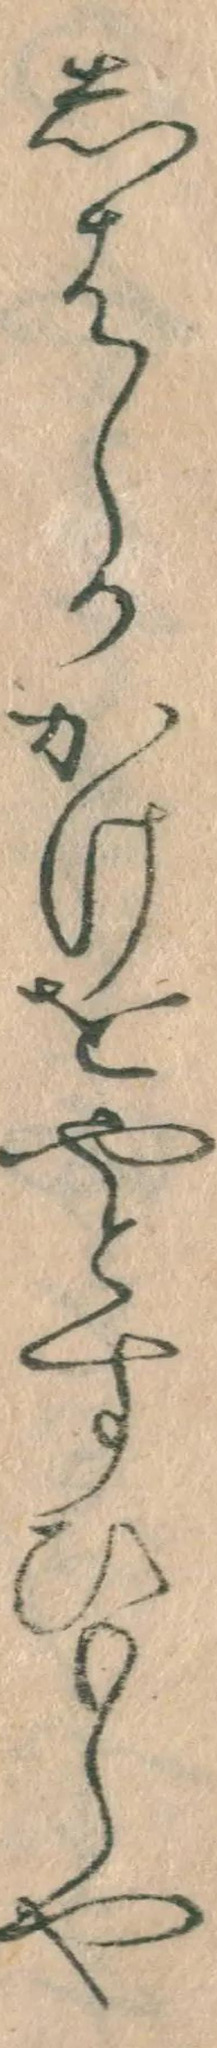しはしかけをやとすひもしや
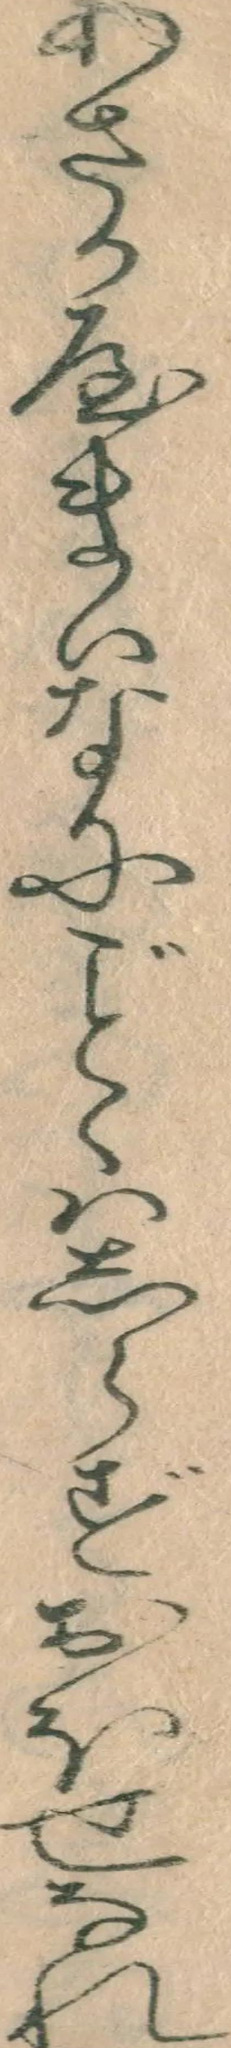あさかやまはなにごとゝはしらずおほせなれ
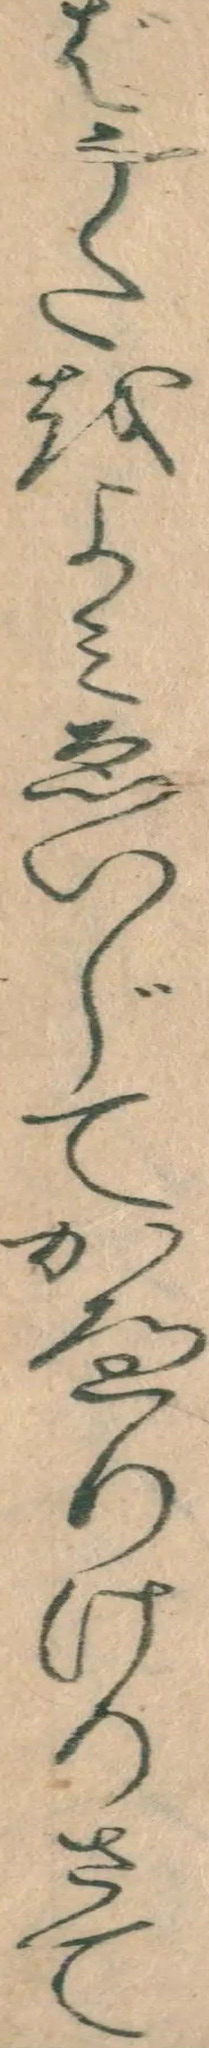ばうたをよみゑいじてかへりけりさて
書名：いつくしまの御ほん地 3巻
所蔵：国立国会図書館 National Diet Library, JAPAN
